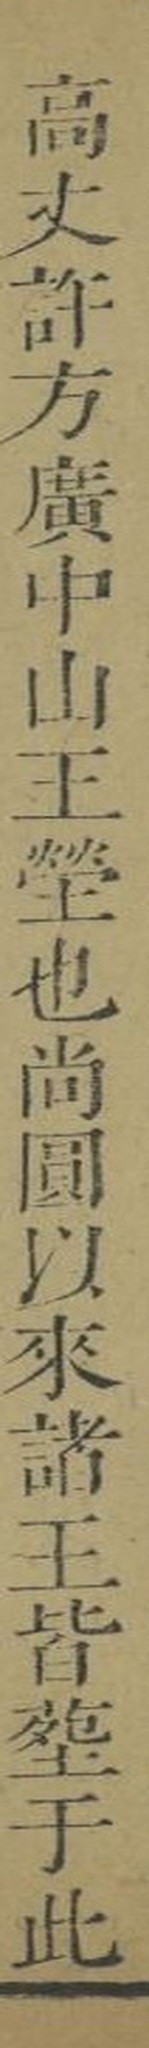高丈許方広中山王塋也尚円以来諸王皆葬于此
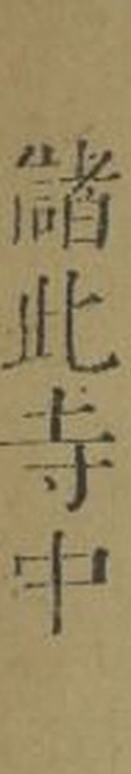儲此寺中

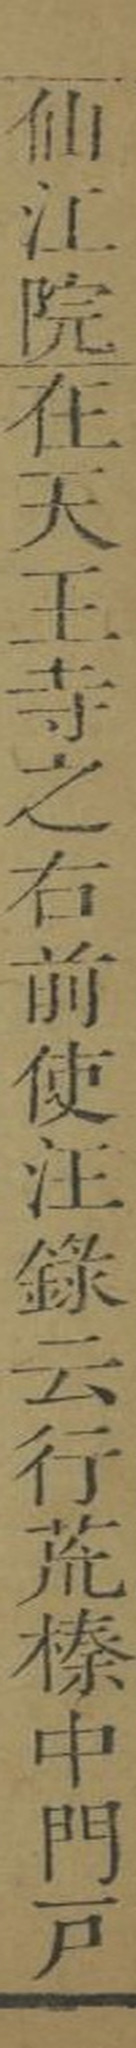[仙江院]在天王寺之右前使汪録云行荒榛中門戸
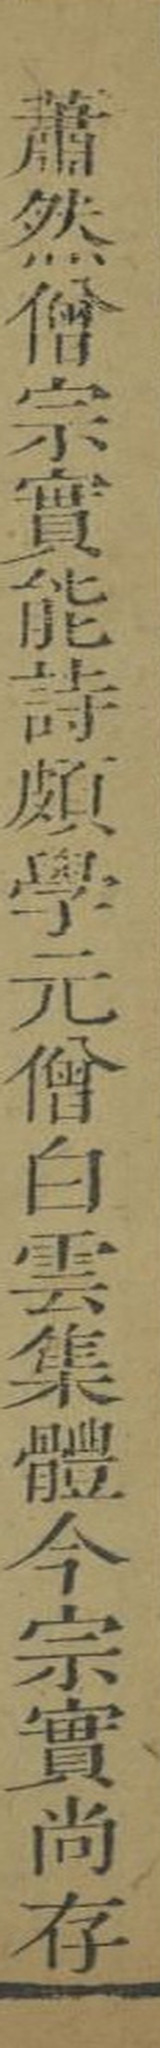蕭然僧宗実能詩頗学元僧白雲集体今宗実尚存
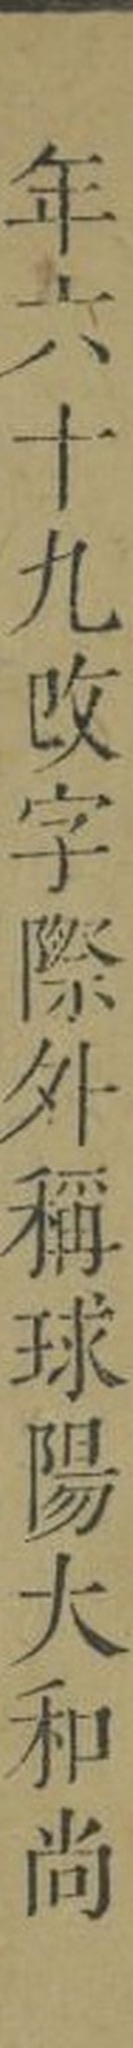年六十九改字際外称球陽大和尚
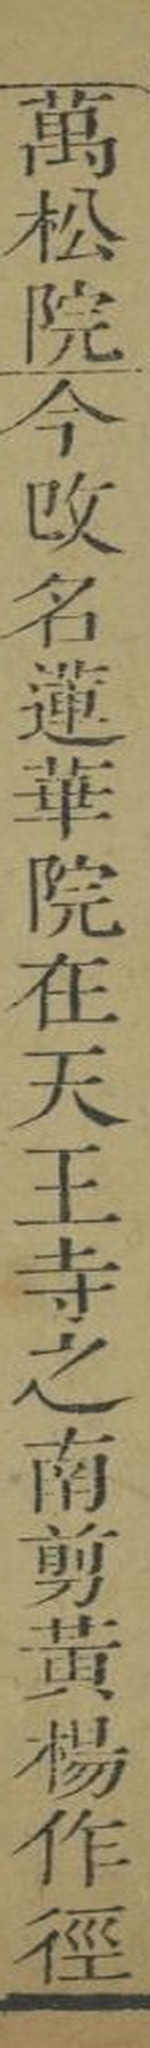[万松院]今改名蓮華院在天王寺之南剪黄楊作径
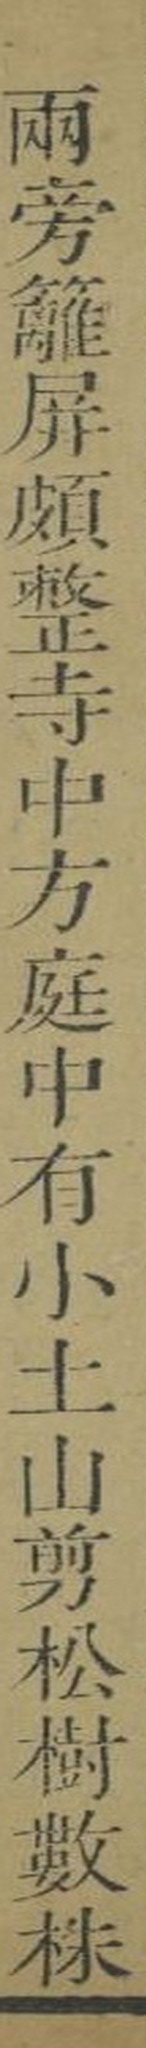両旁籬屏頗整寺中方庭中有小土山剪松樹数株
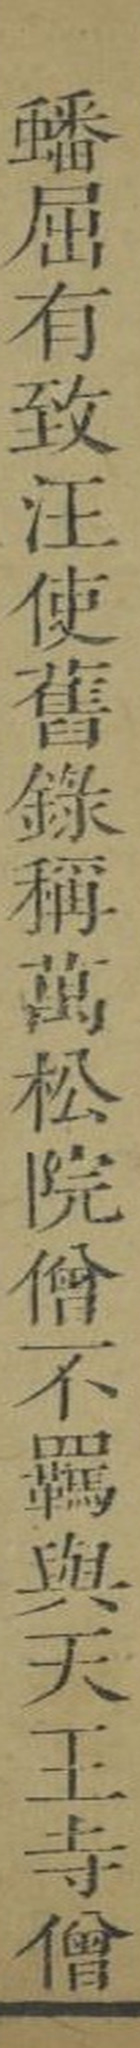蟠屈有致汪使旧録称万松院僧不羈与天王寺僧
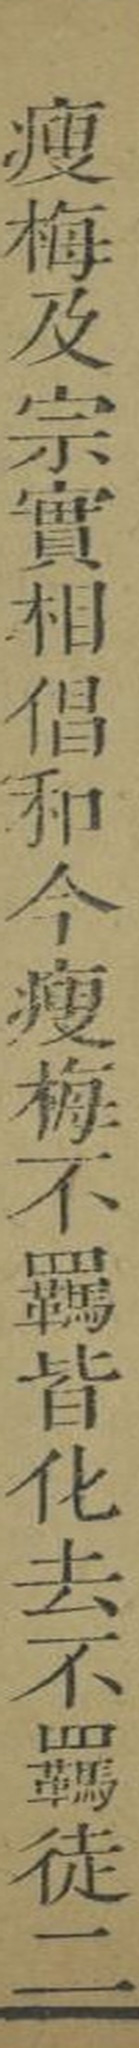痩梅及宗実相倡和今痩梅不羈皆化去不羈徒二
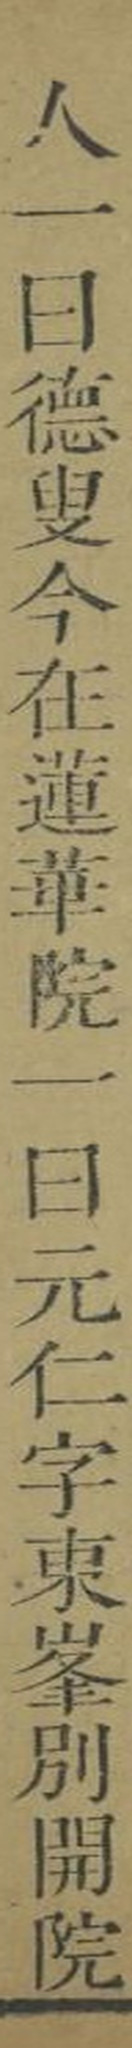人一曰徳叟今在蓮華院一曰元仁字東峰別開院
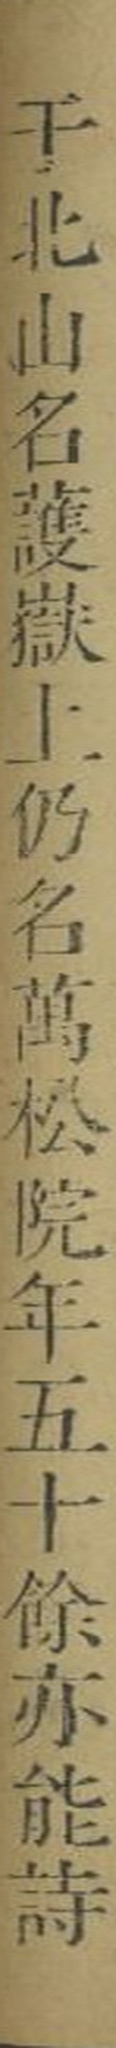于北山名護岳上仍名万松院年五十余亦能詩
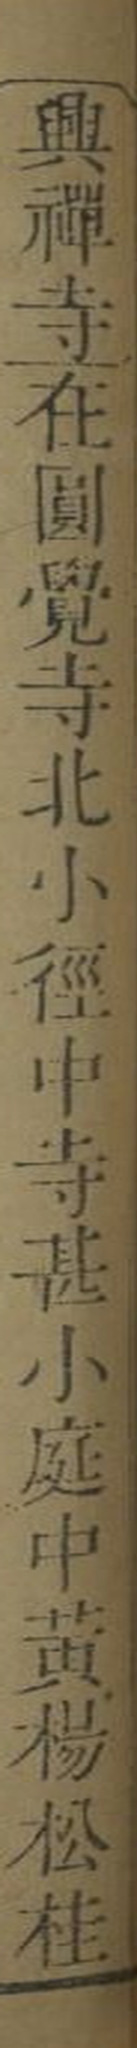[興禅寺]在円覚寺北小径中寺甚小庭中黄楊松桂
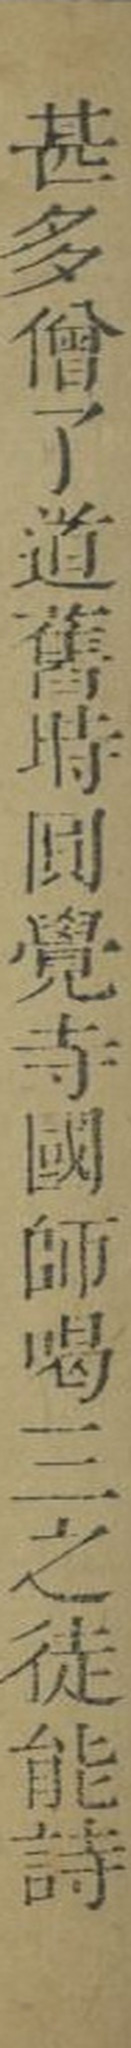甚多僧了道旧時円覚寺国師喝三之徒能詩
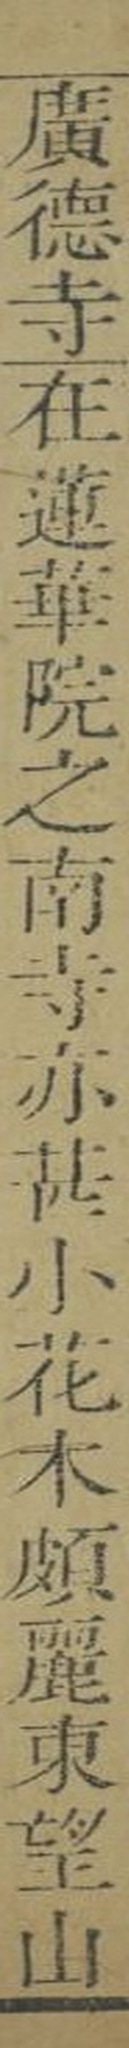[応徳寺]在蓮華院之南寺亦甚小花木頗麗東望山
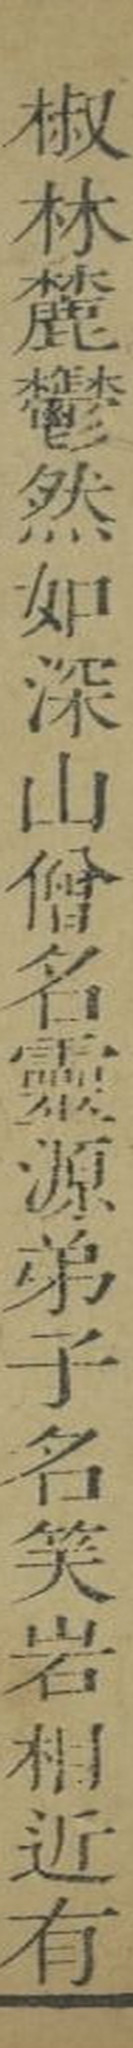椒林麓鬱然如深山僧名霊源弟子名笑岩相近有
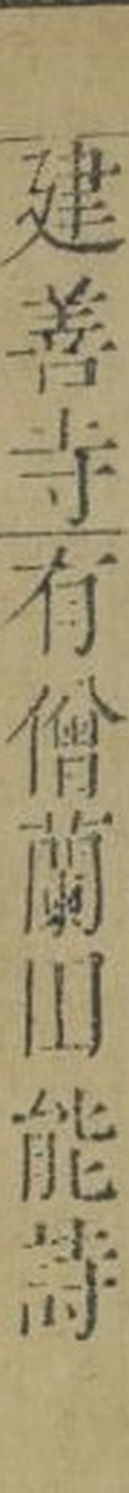[建善寺]有僧蘭田能詩
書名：中山伝信録 巻四
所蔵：University of the Ryukyus Library
